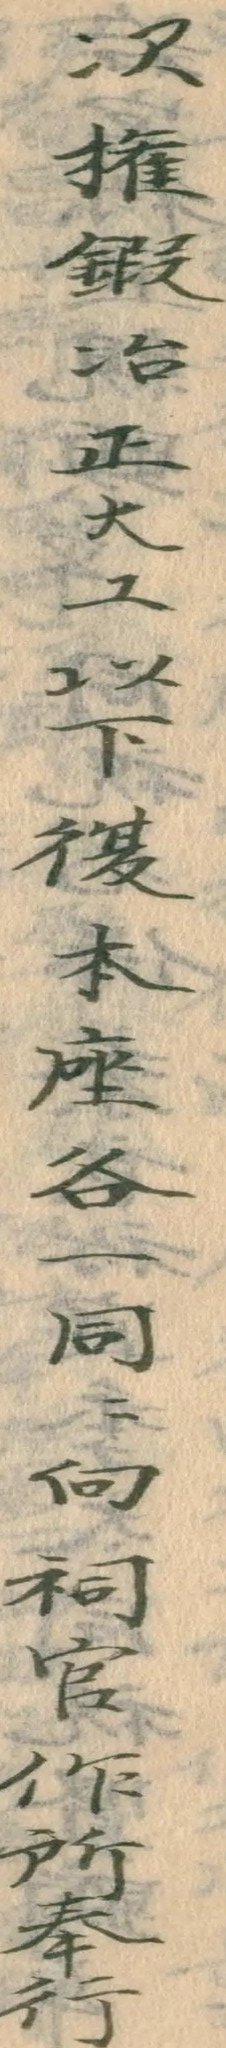次権鍛冶正大工以下復本座各一同ニ向祠官作所奉行
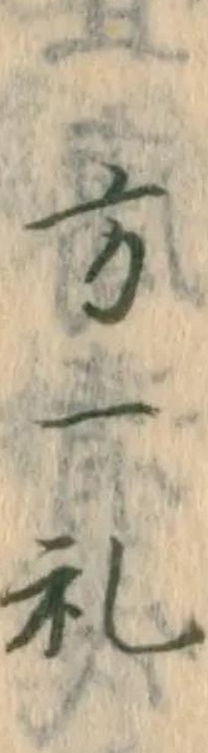方一礼
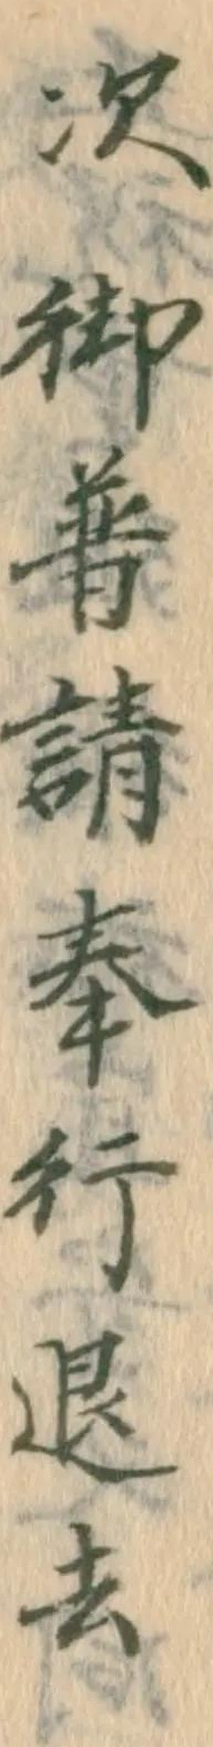次御普請奉行退去
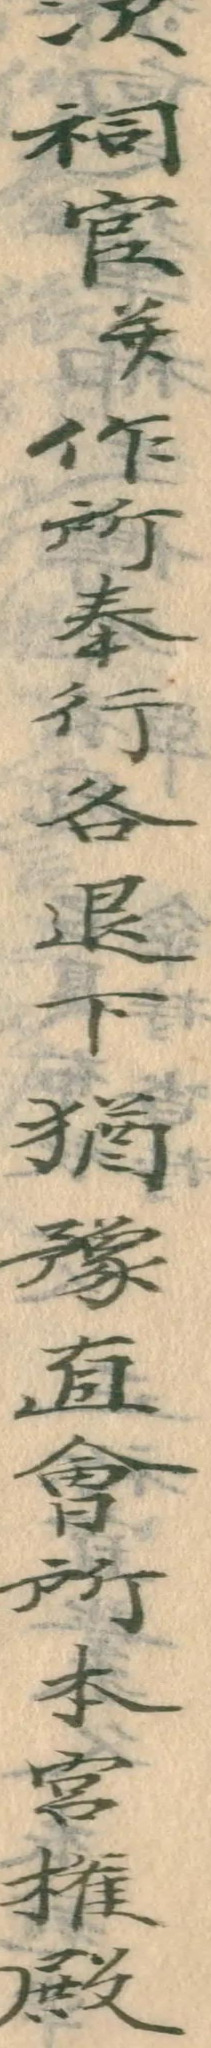次祠官并作所奉行各退下猶予直会所本宮権殿
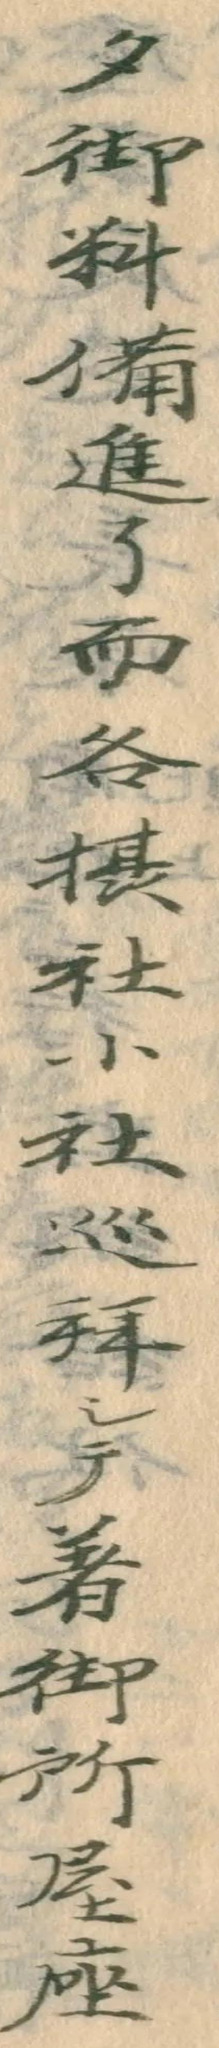夕御料備進了而各摂社小社巡拝シテ着御所屋座
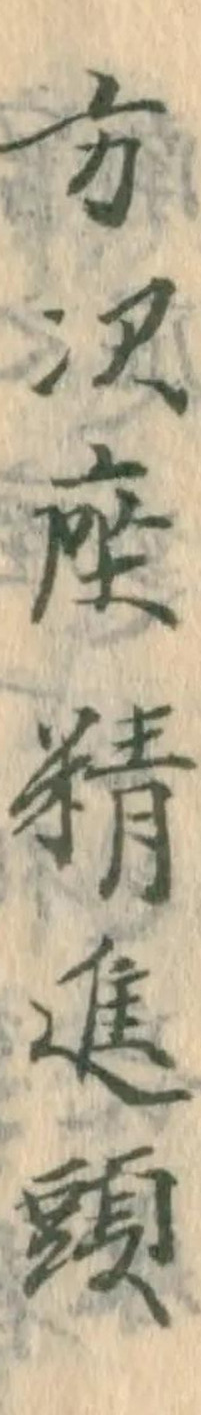方次座精進頭

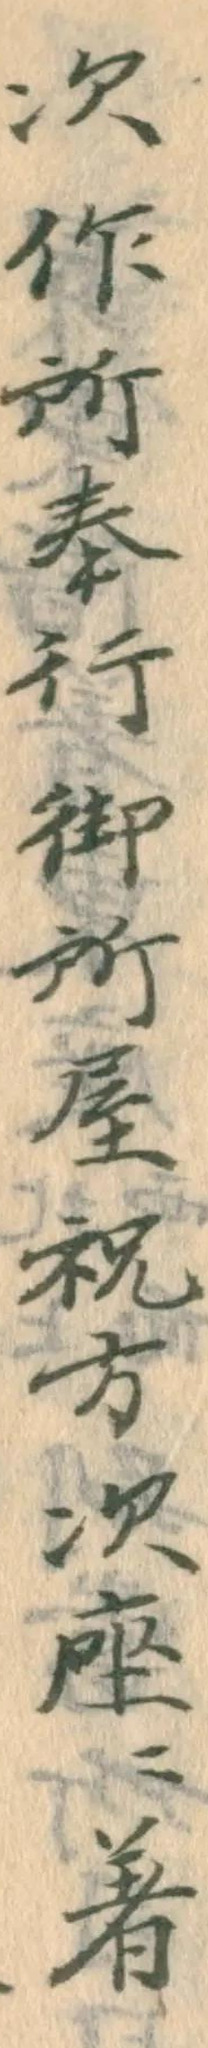次作所奉行御所屋祝方次座ニ着
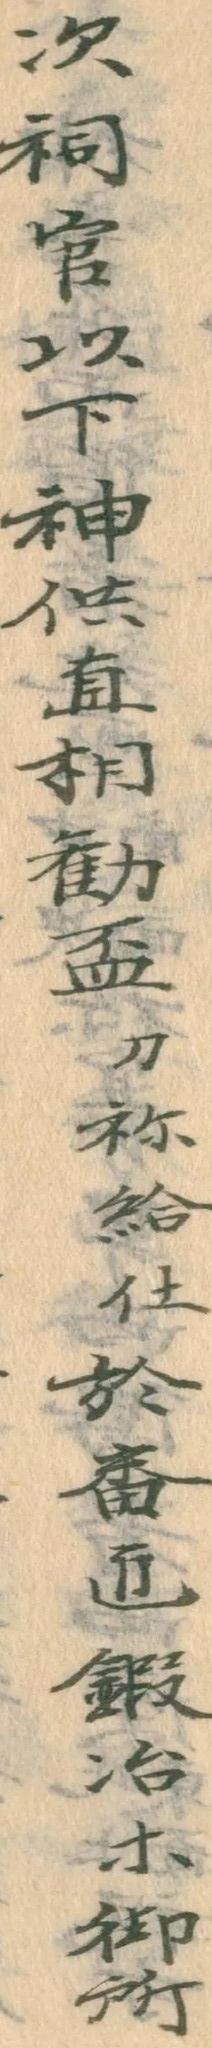次祠官以下神供直相勧盃刀祢給仕於番匠鍛冶等御所
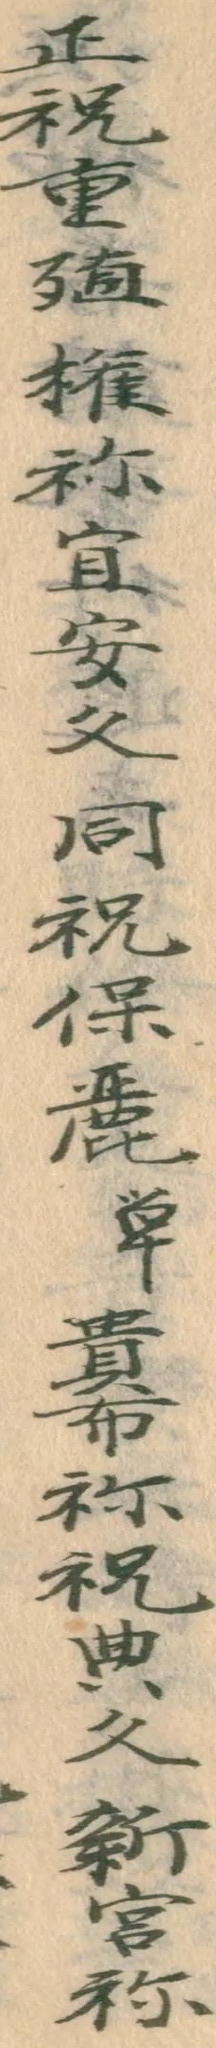正祝重殖権祢宜安久同祝保麗単貴布祢祝典久新宮祢
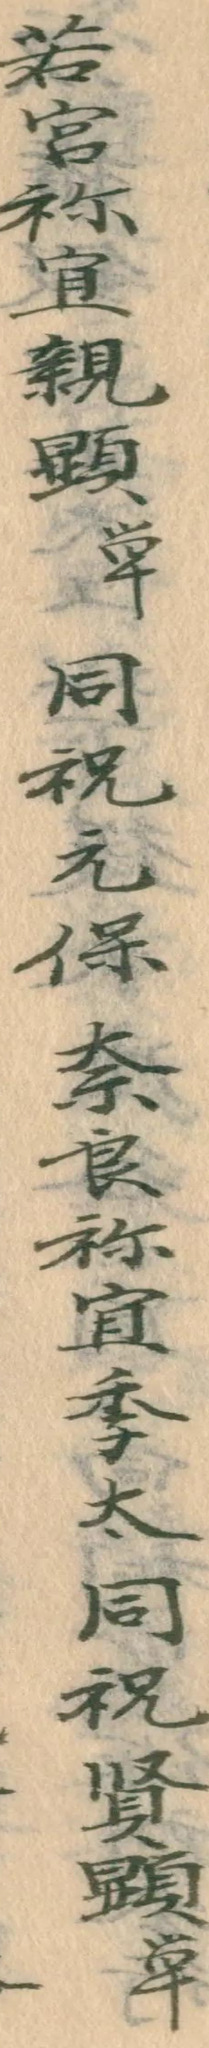若宮祢宜親顕単同祝元保奈良祢宜季太同祝賢顕単
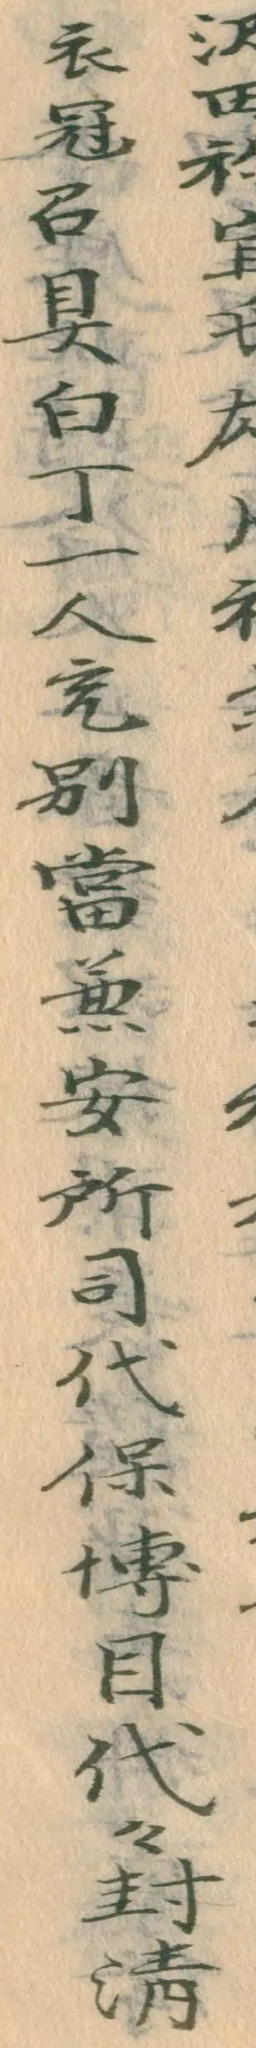衣冠召具白丁一人充別当兼安所司代保博目代々封清
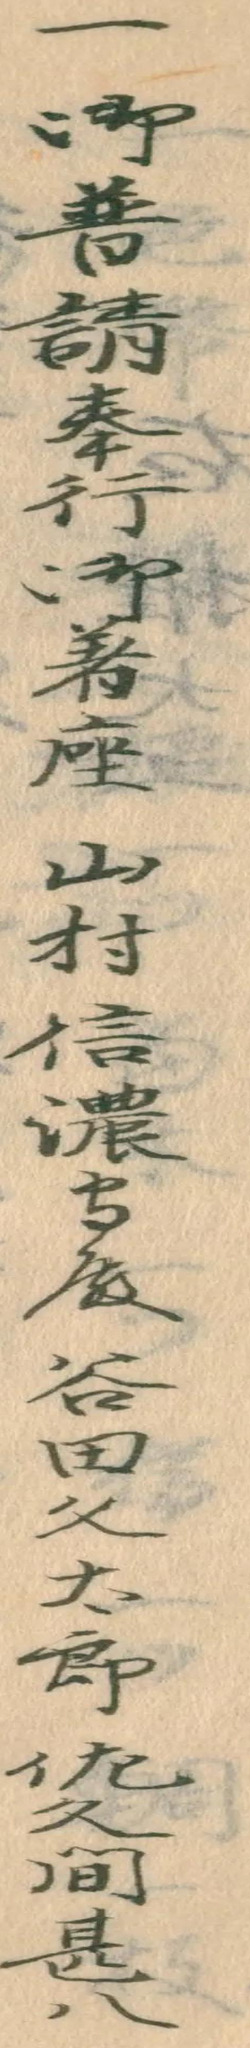一御普請奉行御着座山村信濃守殿谷田久太郎佐久間甚八
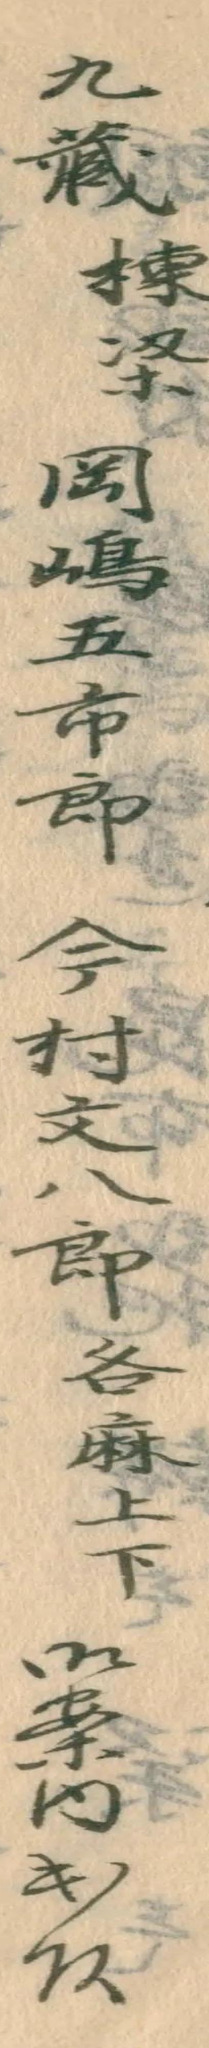九蔵棟梁岡嶋五市郎今村文八郎各麻上下御案内出頭
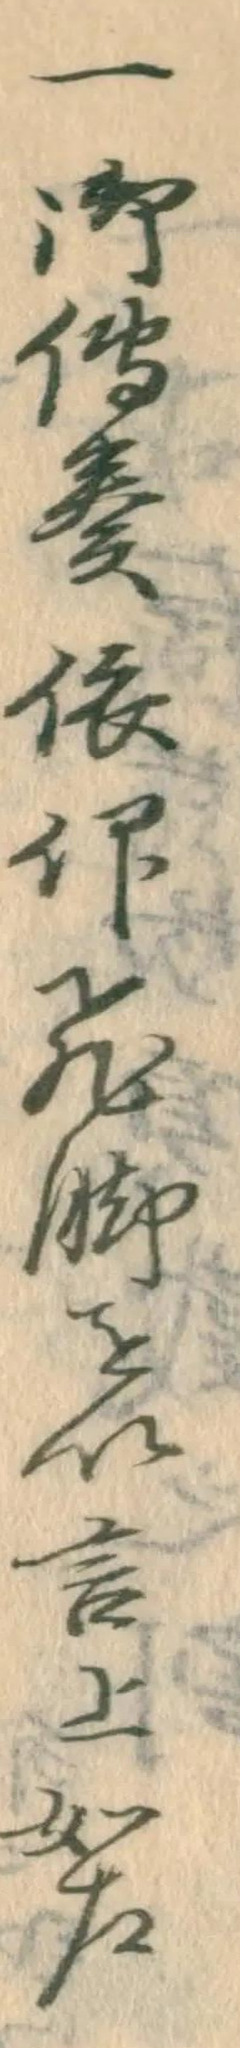一御伝奏依仰飛脚を以言上如左
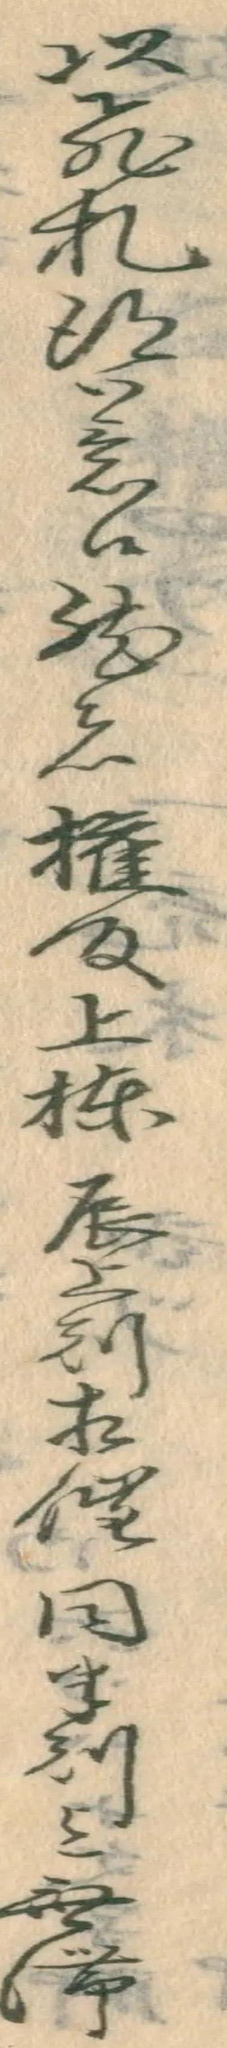以飛札跡御意候然は権殿上棟辰上刻相催同半刻迄無滞
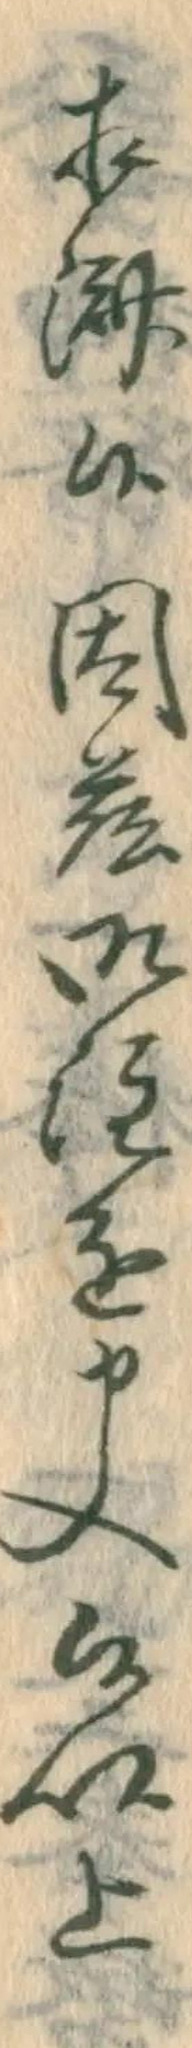相済候因茲御注進申入候以上
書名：賀茂社記録. 第17冊
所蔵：国立国会図書館 National Diet Library, JAPAN
